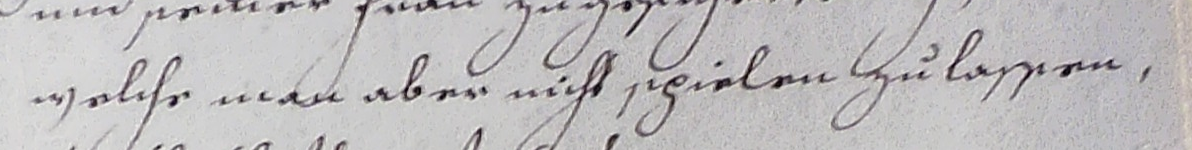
welche man aber nicht spielen zulassen,
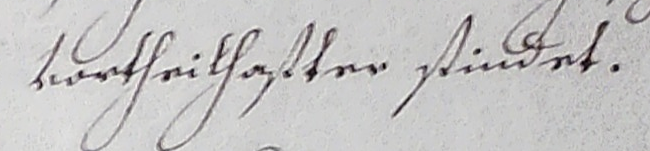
vortheilhafter findet.
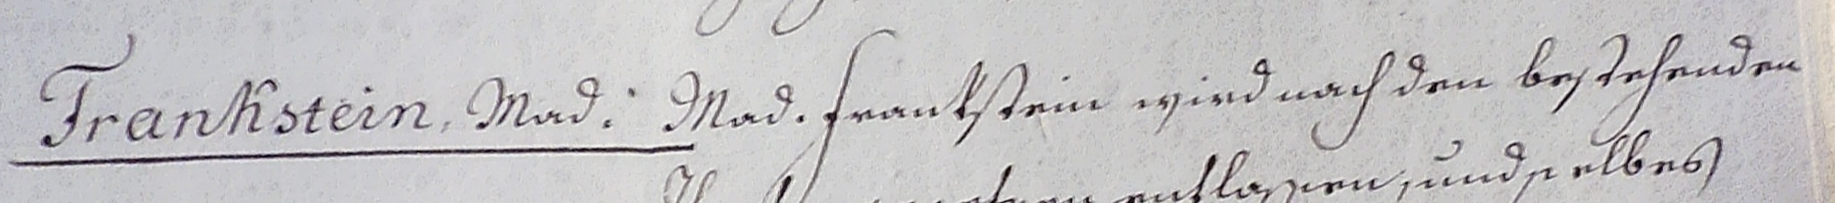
Frankstein, Mad. Mad. Frankstein wird nach den bestehenden
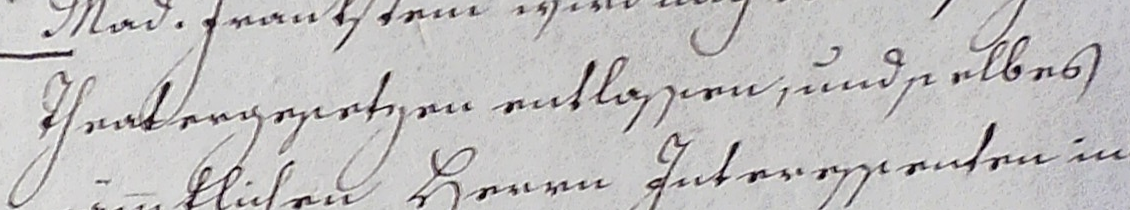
Theatergesetzen entlassen, und selbes
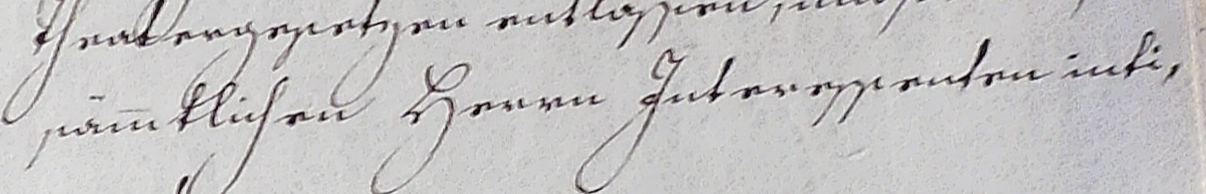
säm̅tlichen Herrn Interessenten inti¬
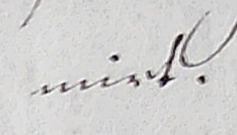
mirt.
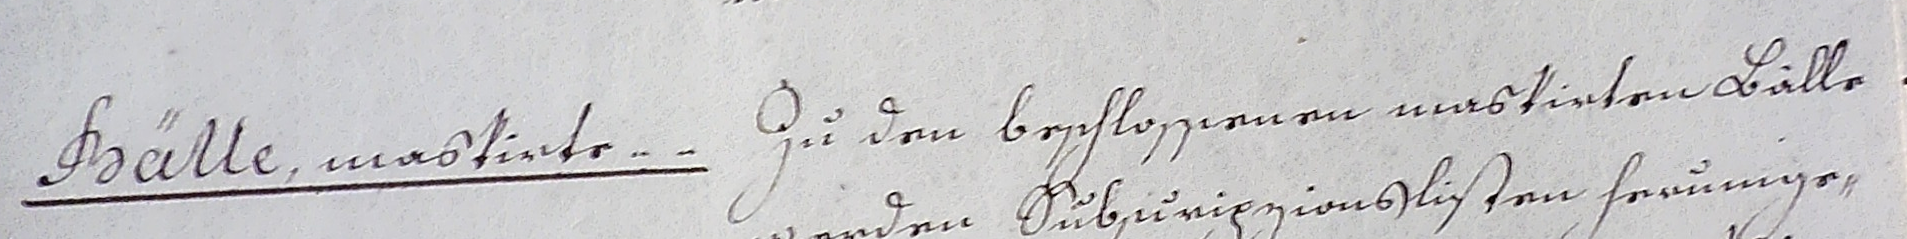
Bälle, maskirte .. .. Zu den beschlossenen maskirten Bälle
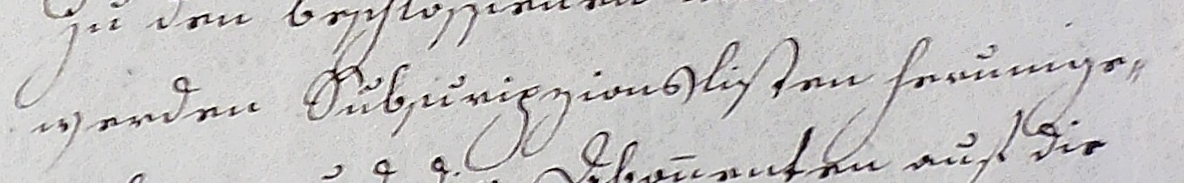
werden Subsuripzionslisten herumge¬
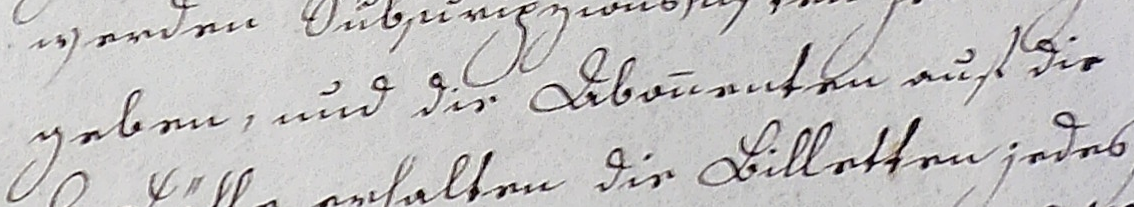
geben, und die Abon̅enten auf die
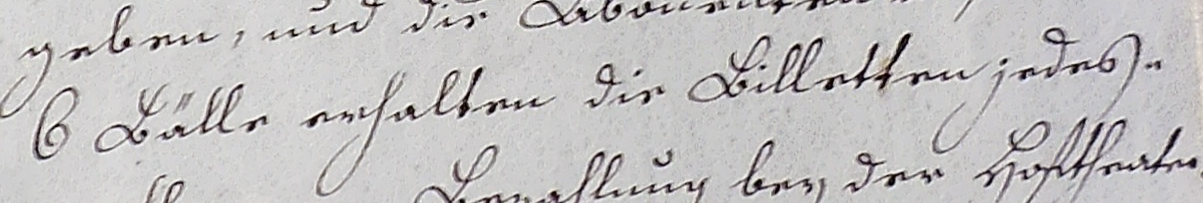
6 Bälle erhalten die Billetten jedes¬
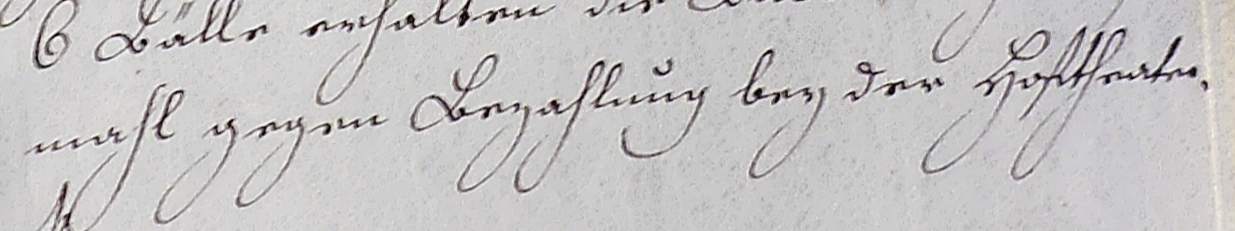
mahl gegen Bezahlung bey der Hoftheater¬
